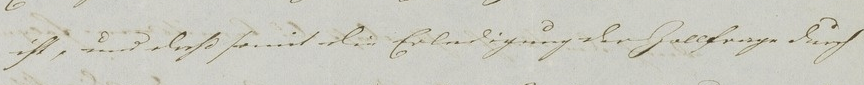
ist, und daß somit die Erledigung der Zollfrage durch
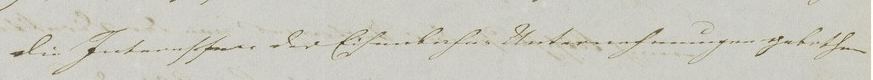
die Interessen der Eisenbahn-Unternehmungen gebothen
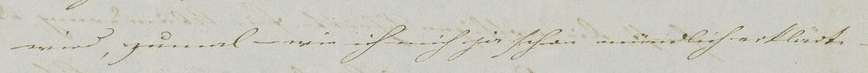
wird, zumal – wie ich mich ja schon mündlich erklärte –
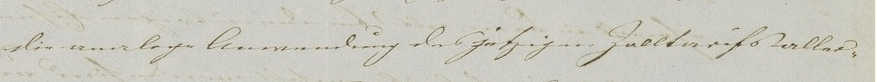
die analoge Anwendung des jetzigen Zolltarifs aller-
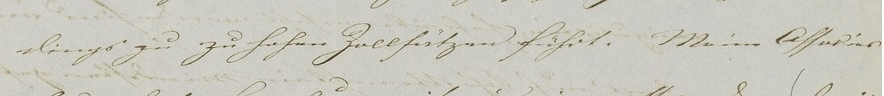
dings zu zu hohen Zollsätzen führt. Meine Associes
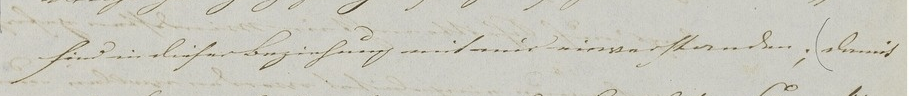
sind in dieser Beziehung mit mir einverstanden; damit
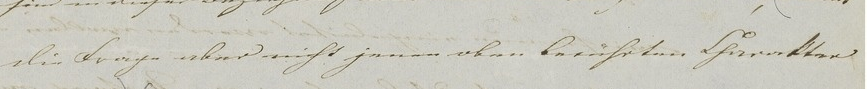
die Frage aber nicht jenen oben berührten Charakter
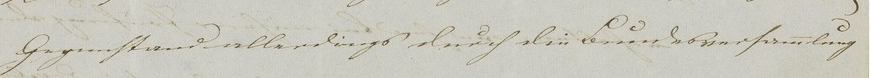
Gegenstand allerdings durch die Bundesversammlung
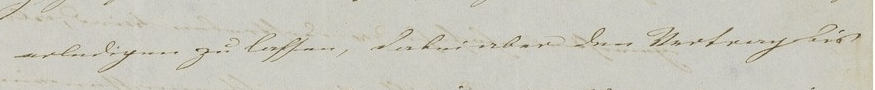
erledigen zu lassen, dabei aber den Vertrag bis
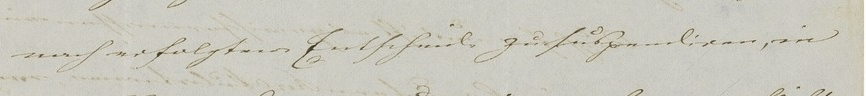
nach erfolgtem Entscheide zu suspendiren, in
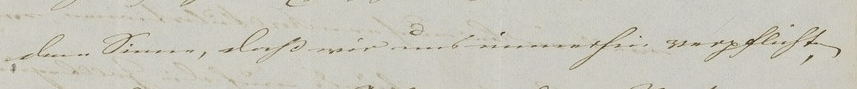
dem Sinne, daß wir uns immerhin verpflichten,
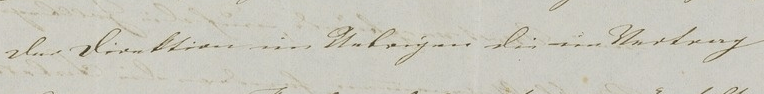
der Direktion im Uebrigen die im Vertrag
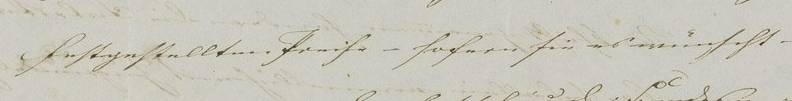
festgestellten Preise – sofern sie es wünscht –
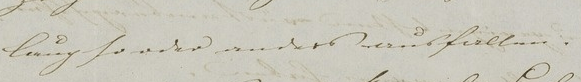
lung so oder anders ausfallen.
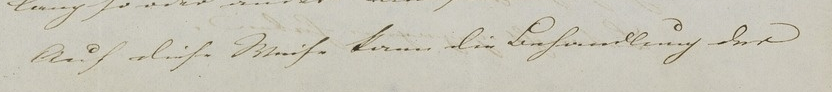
Auf diese Weise kann die Behandlung der
